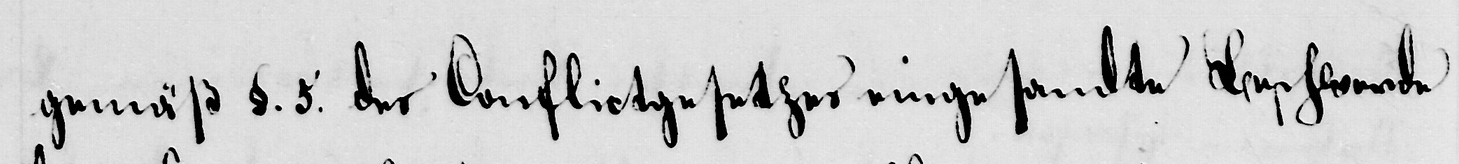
gemäß §. 5. des Conflictgesetzes eingesandte Beschwerde
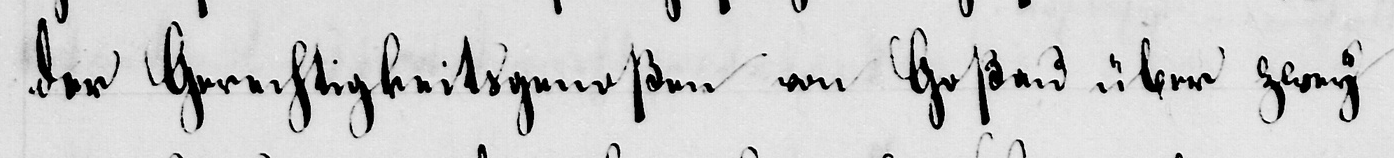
der Gerechtigkeitsgenoßen von Goßau über zwey
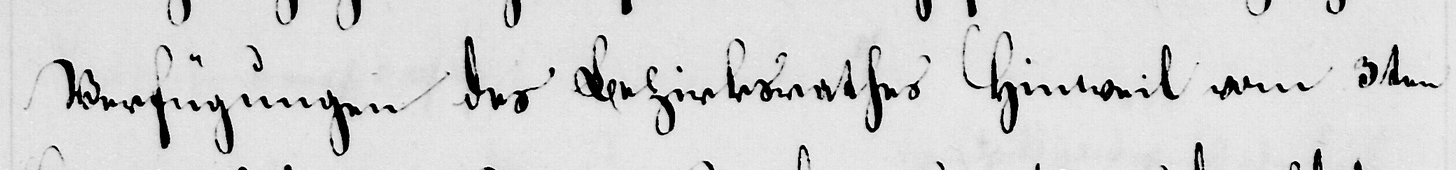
Verfügungen des Bezirksrathes Hinweil vom 3ten
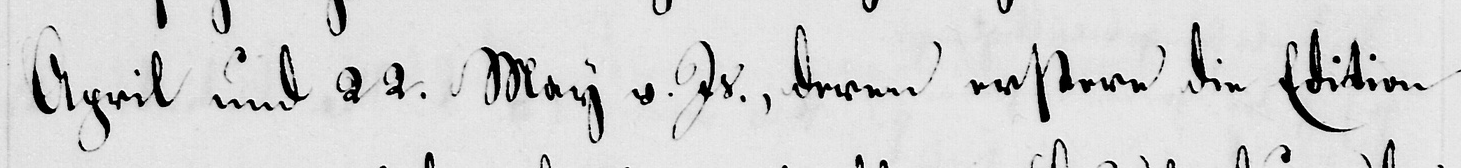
April und 22. May v. Js., deren erstere die Edition
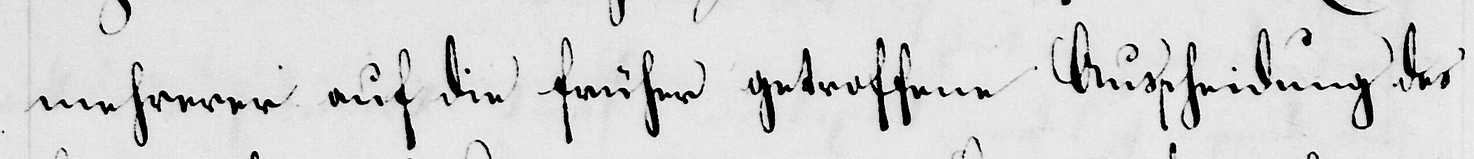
mehrerer auf die früher getroffene Ausscheidung des
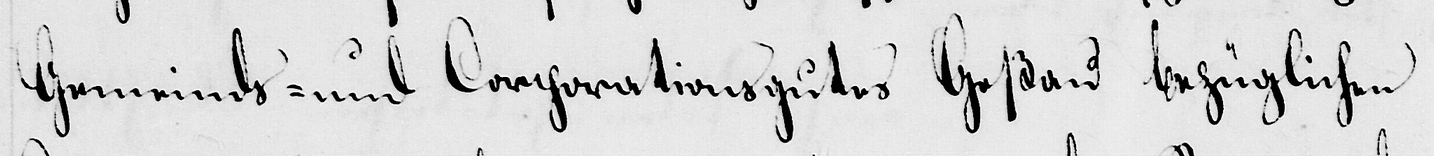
Gemeinds- und Corporationsgutes Goßau bezüglichen
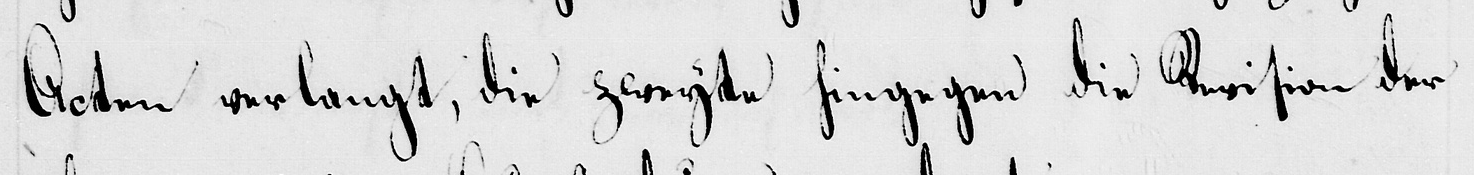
Acten verlangt, die zweyte hingegen die Revision der
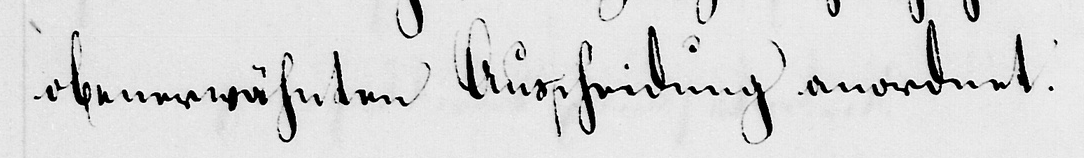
obenerwähnten Ausscheidung anordnet.
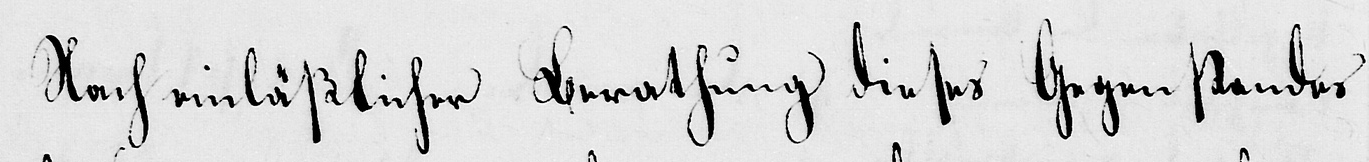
Nach einläßlicher Berathung dieses Gegenstandes
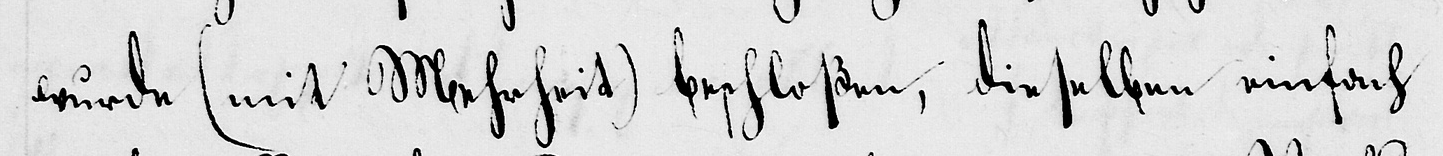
wurde (mit Mehrheit) beschloßen, dieselben einfach
